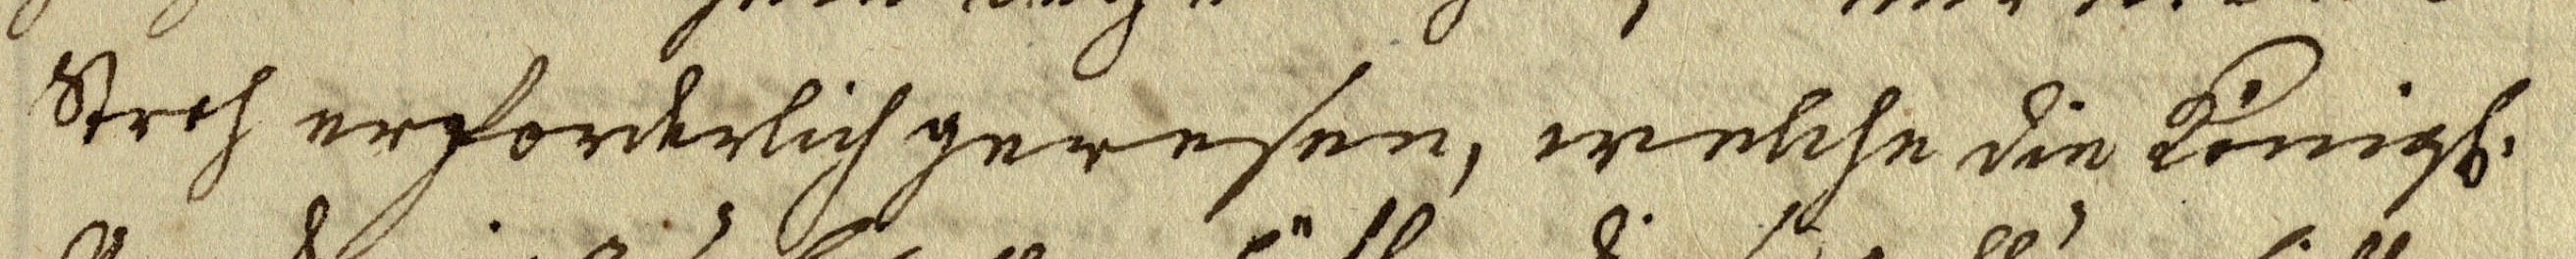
Stroh erforderlich gewesen, welche die Königl:
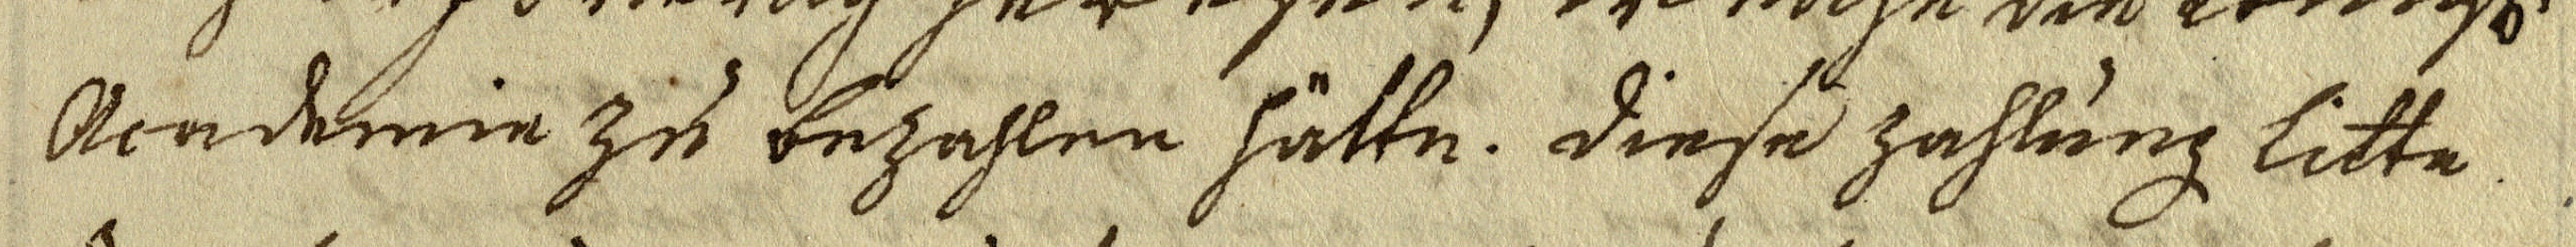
Academie zu bezahlen hätte. Diese Zahlung litte
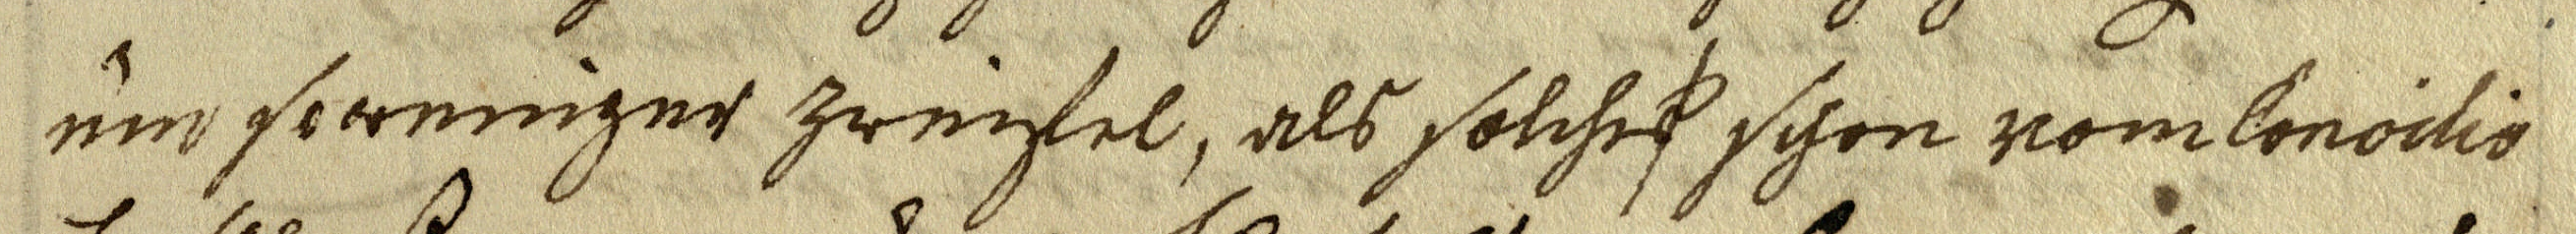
um so weniger Zweifel, als solches schon vom Concilio
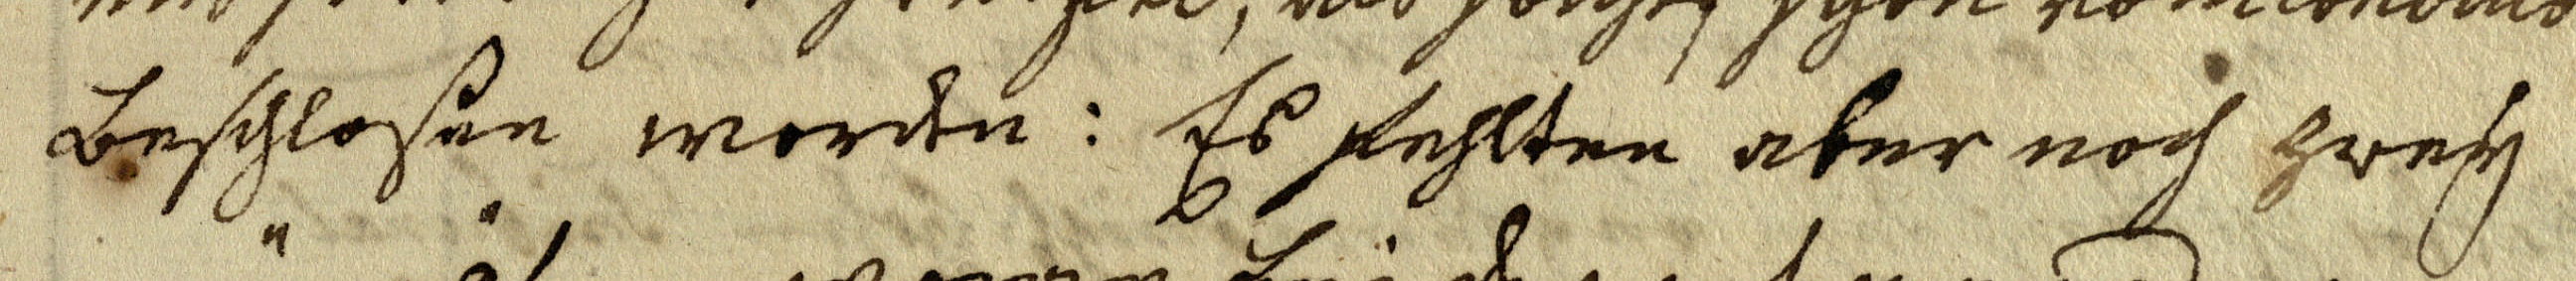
beschlossen worden: es fehlten aber noch zweÿ
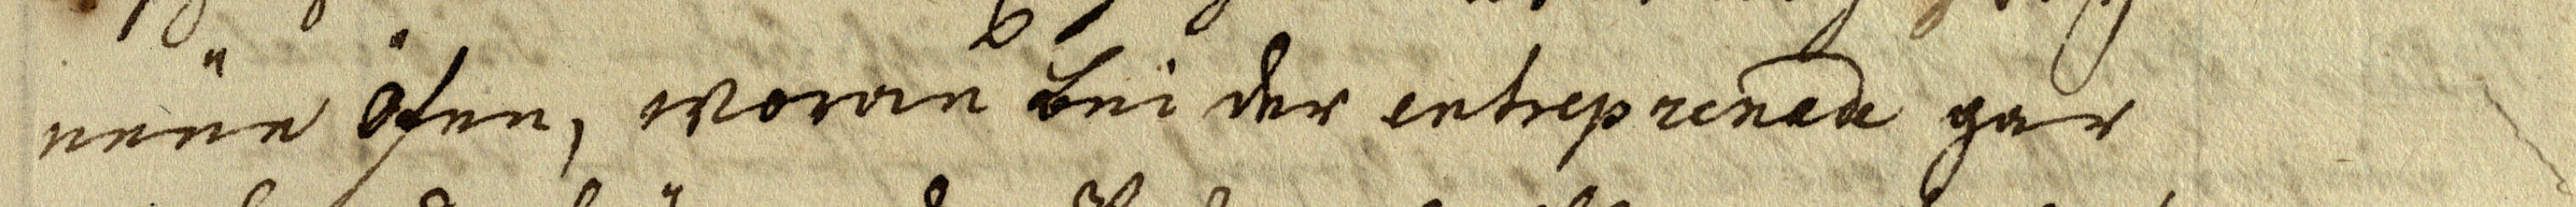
neue Öfen, woran bei der entreprenade gar
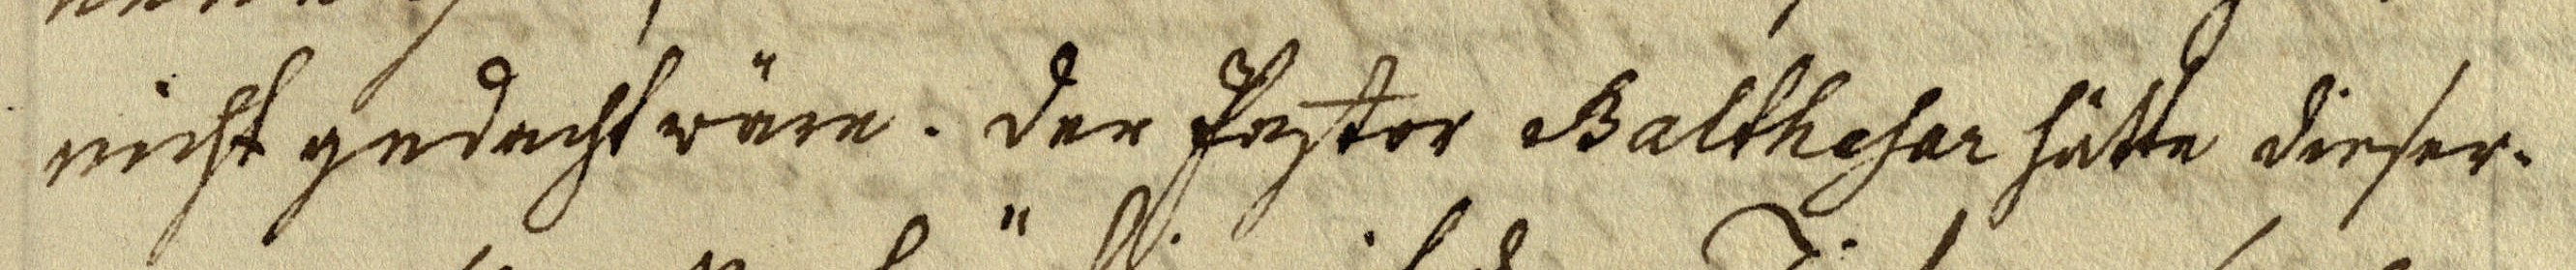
nicht gedacht wäre. Der Pastor Balthasar hätte dieser¬
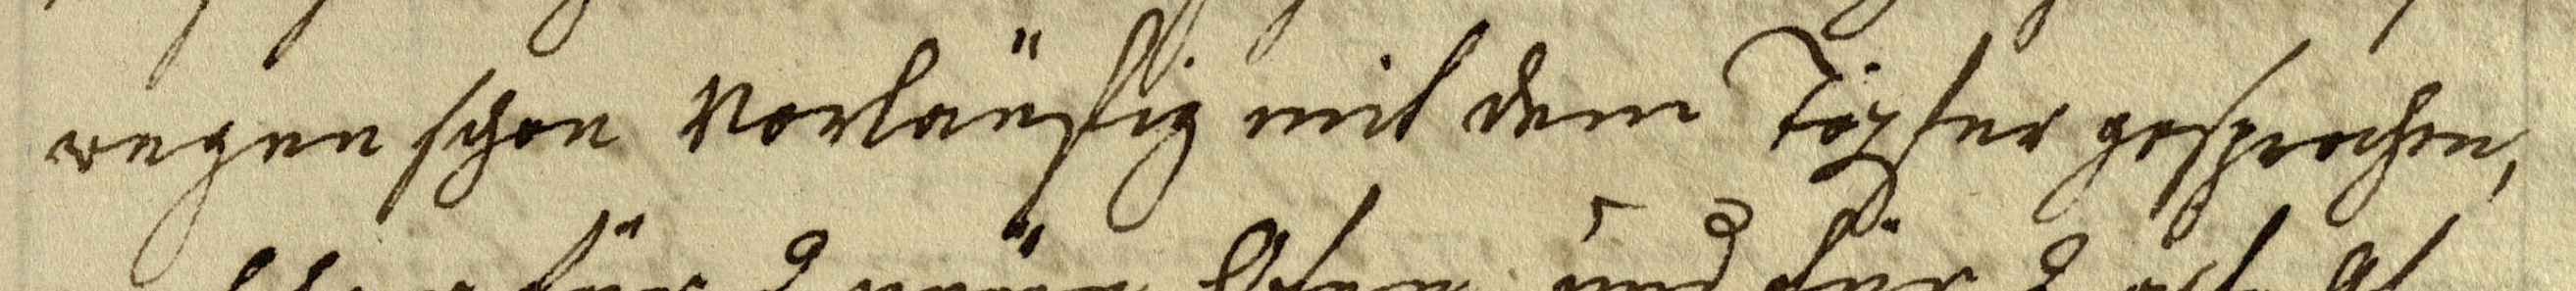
wegen schon vorläufig mit dem Töpfer gesprochen,
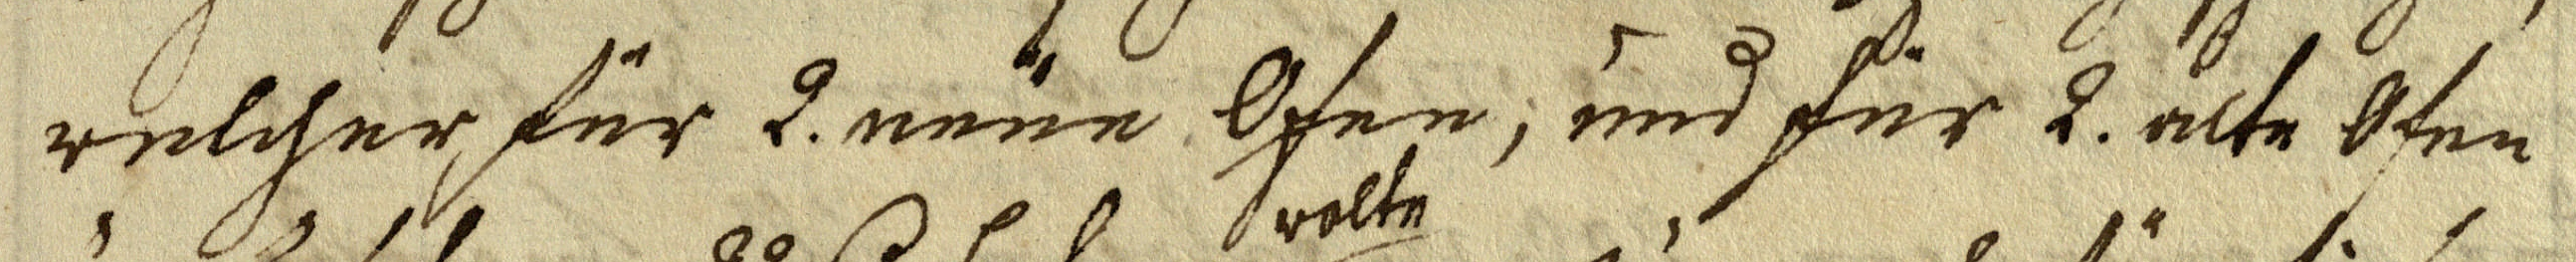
welcher für 2 neue Ofen, und für 2 alte Ofen
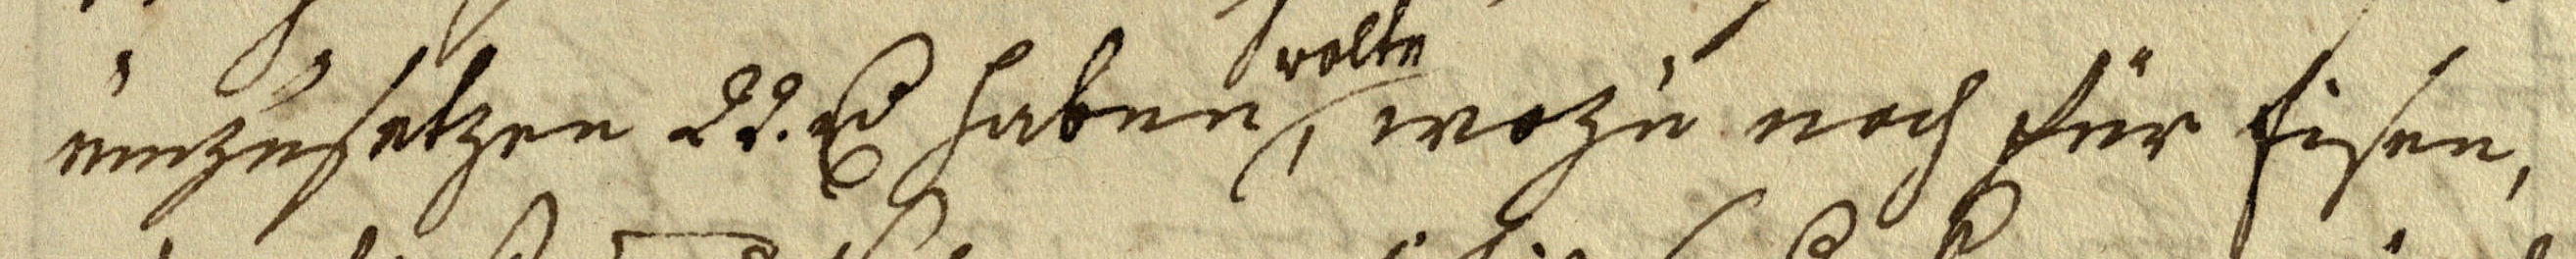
umzusetzen 22. r haben wolte, wozu noch für Eisen,
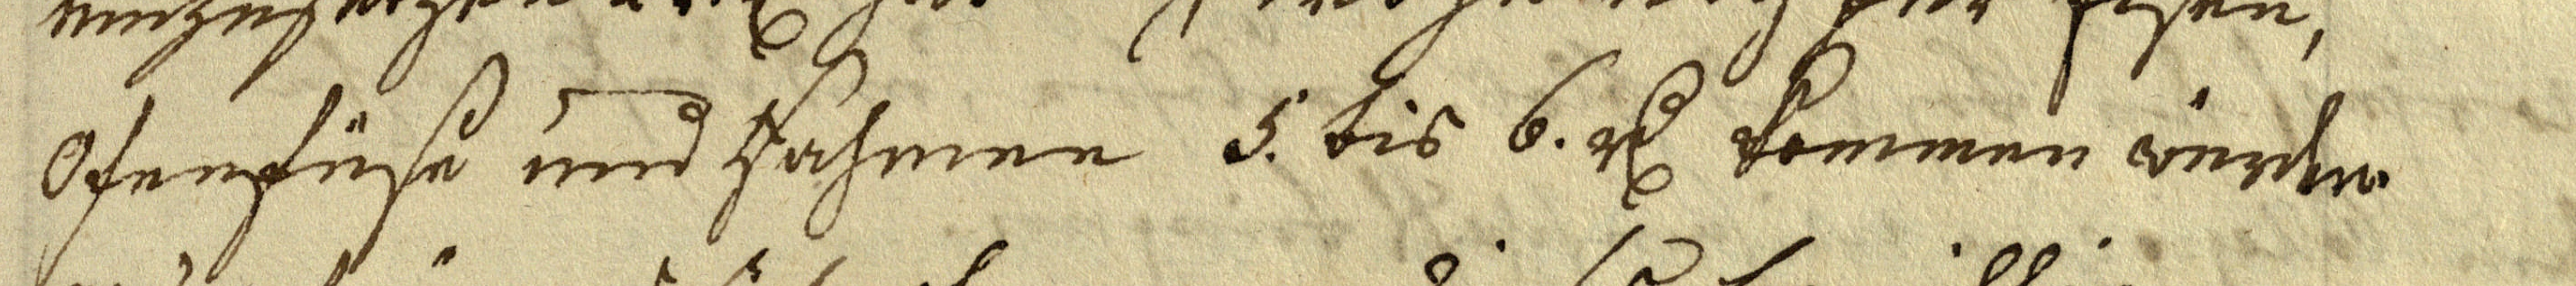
Ofenfüße und Rahmen 5. bis 6. r kommen würden.
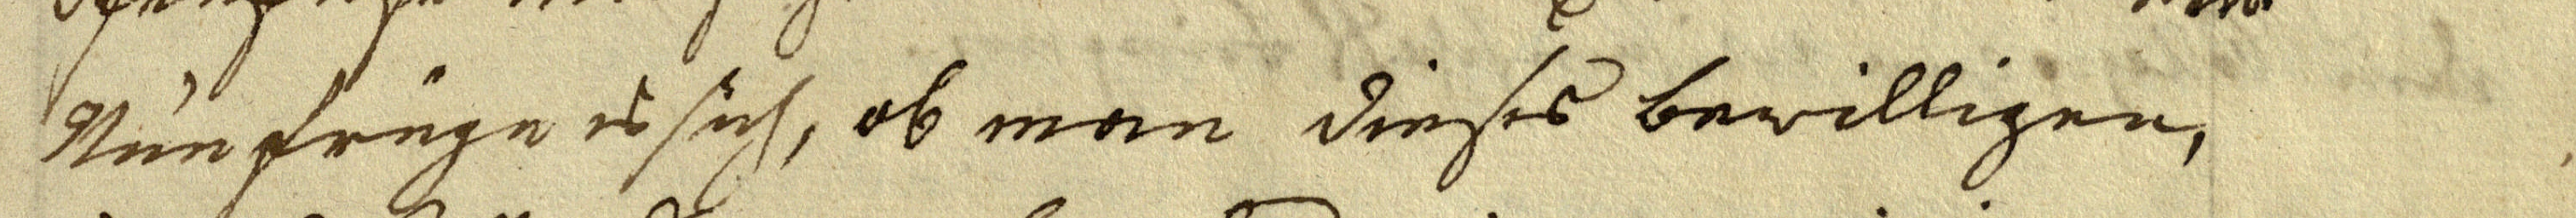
Nun früge er sich , ob man dieses bewilligen,
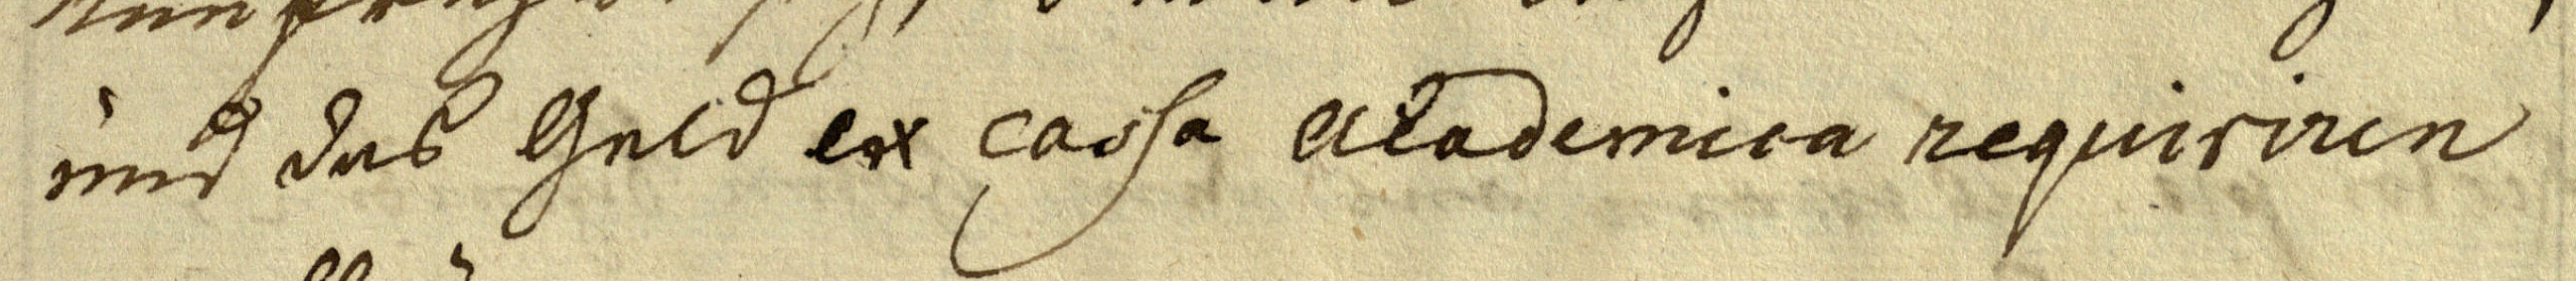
und das Geld ex cassa Akademica requiriren
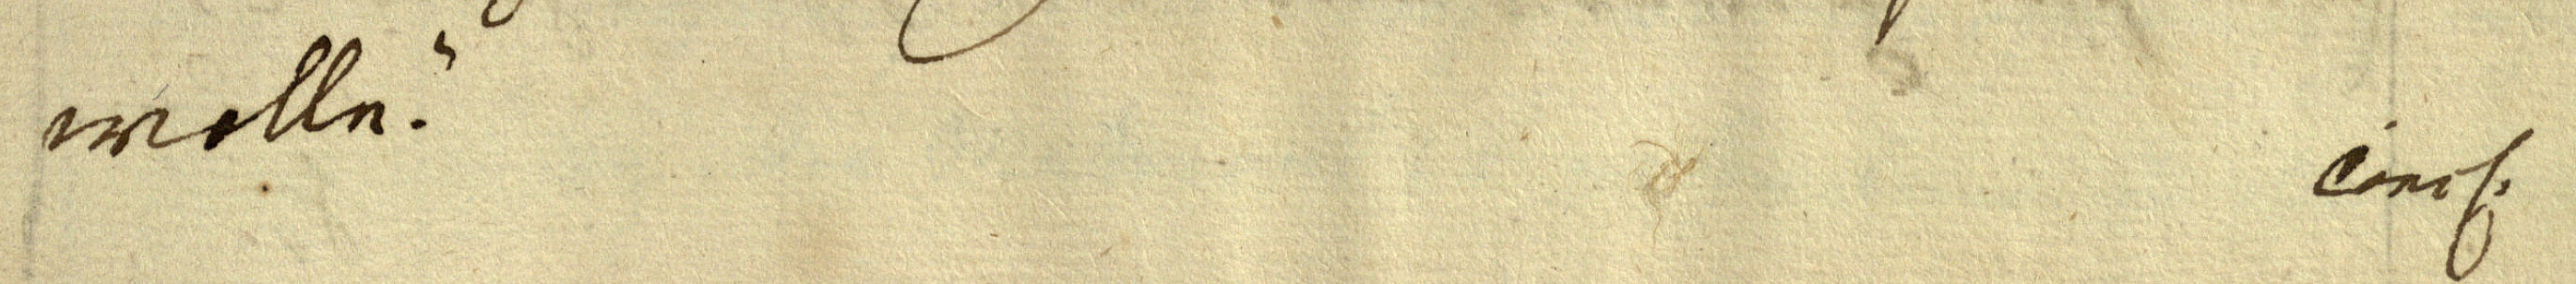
wolle. Concl
